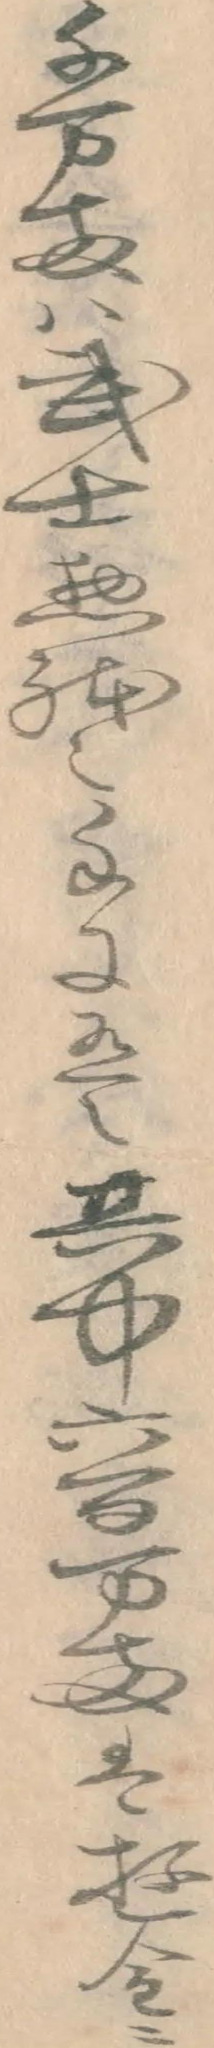千万両は武士惣体之手に有之其中六百万両は遊金に
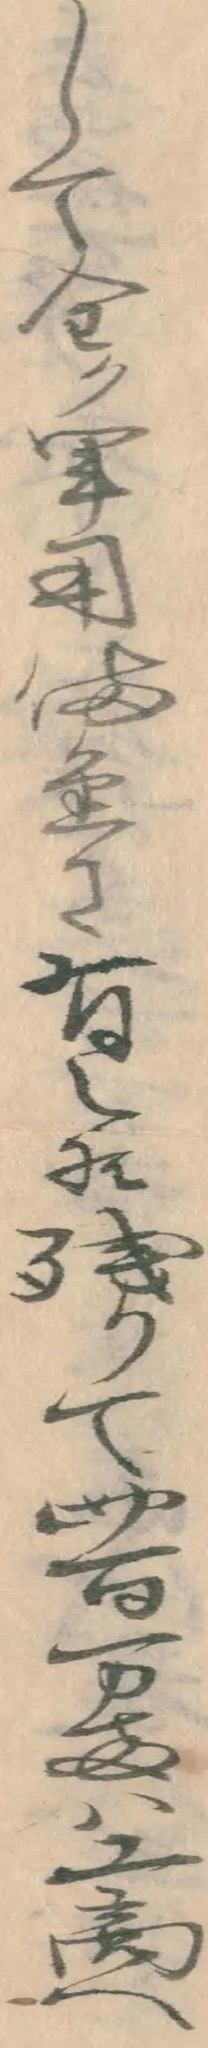して全く軍用備金に有之候残りて四百万両は工商へ
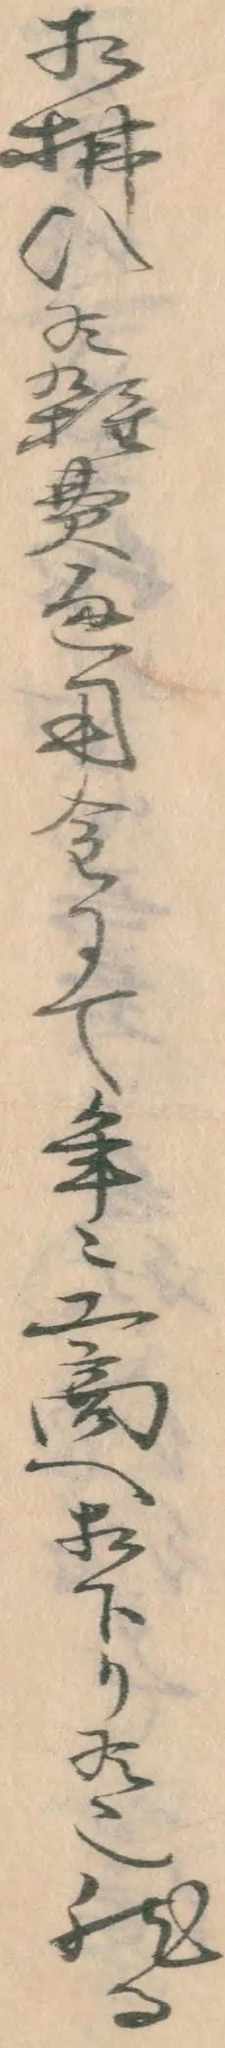相払ひ候雑費通用金にて年々工商へ相下り候也然る
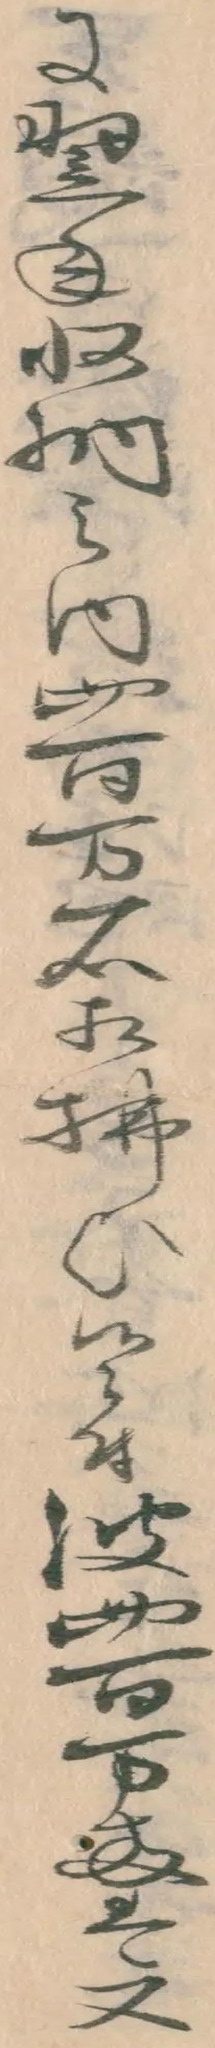に翌年収納之内四百万石相払ひ候に付彼四百万両は又
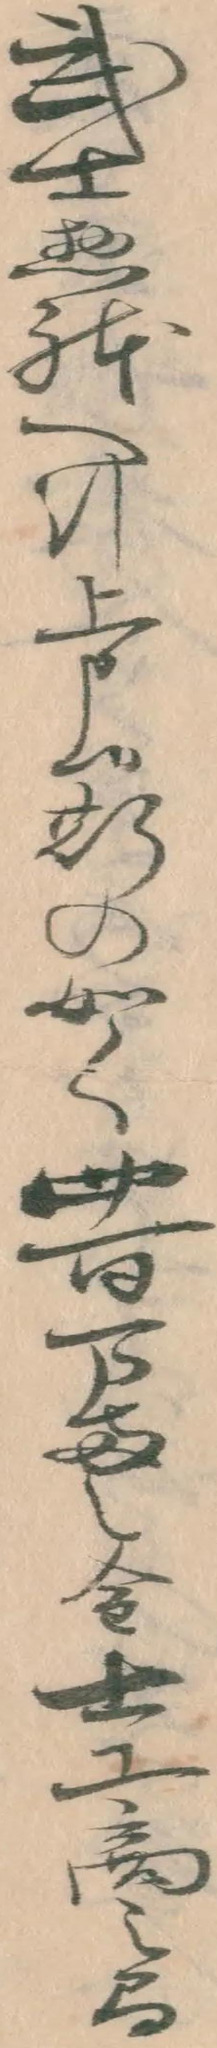武士惣体へ引上申候斯の如く四百万両之金士工商之間
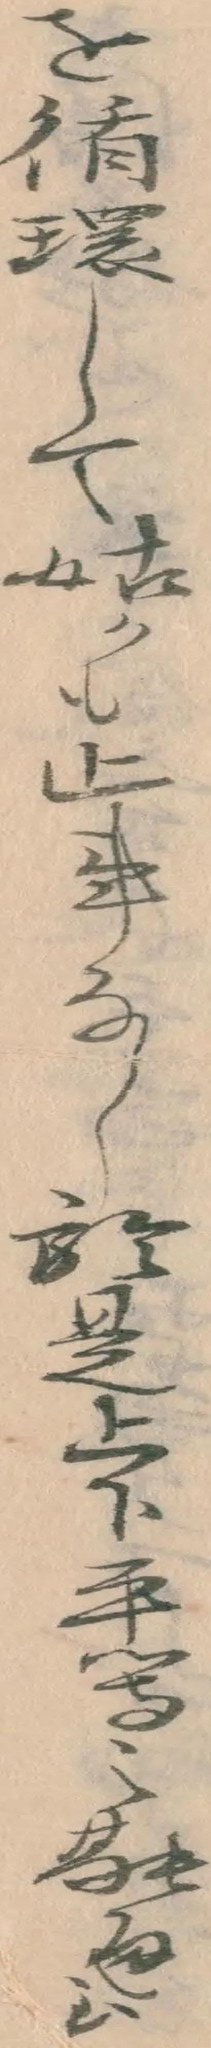を循環して姑くも止事なし於是上下平等の融通至
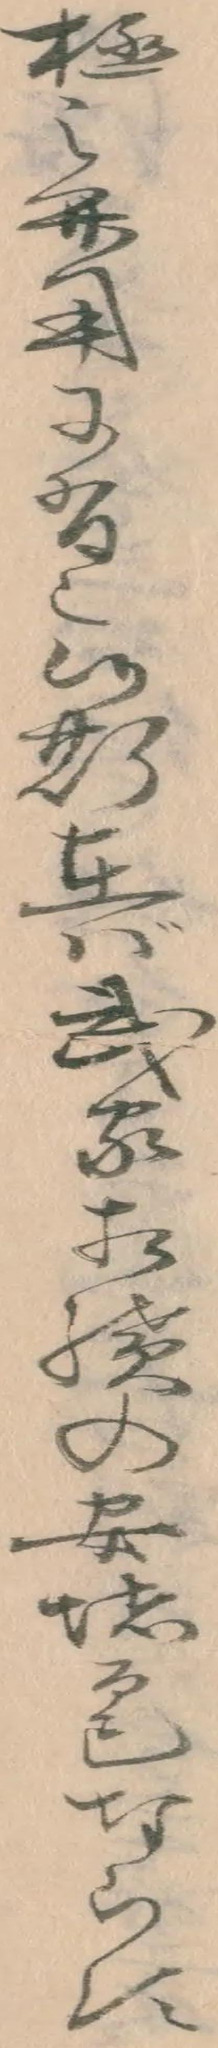極之弁用に有之候斯在ば武家相続の安堵而已ならす
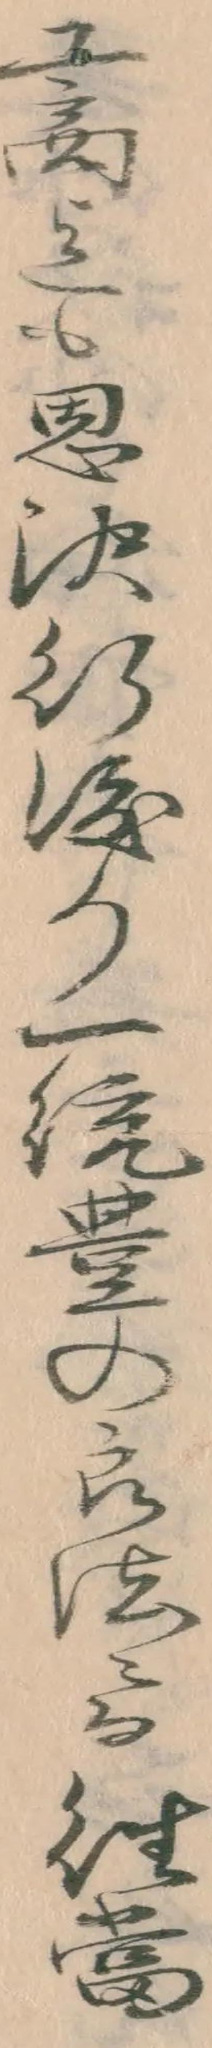工商迄も恩沢行渡り一統豊の良法に而往当
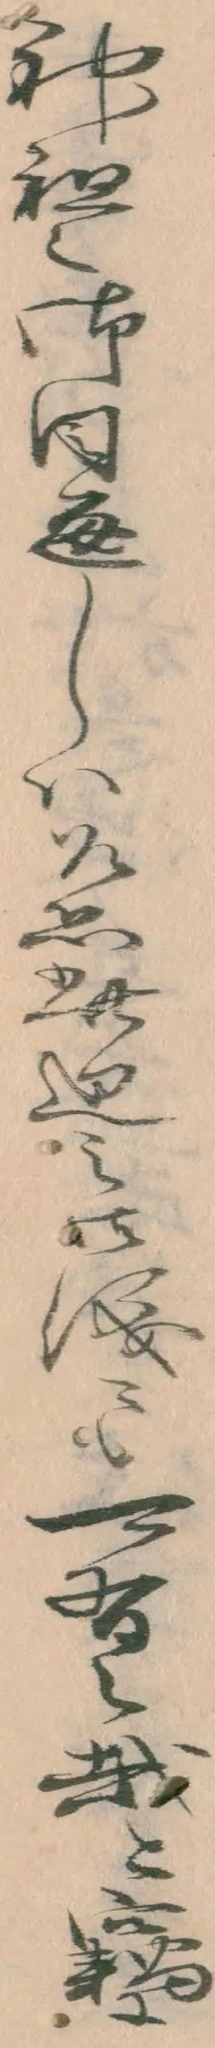神祖之御目通しは乍恐此辺之御儀にも可有之哉と窃に
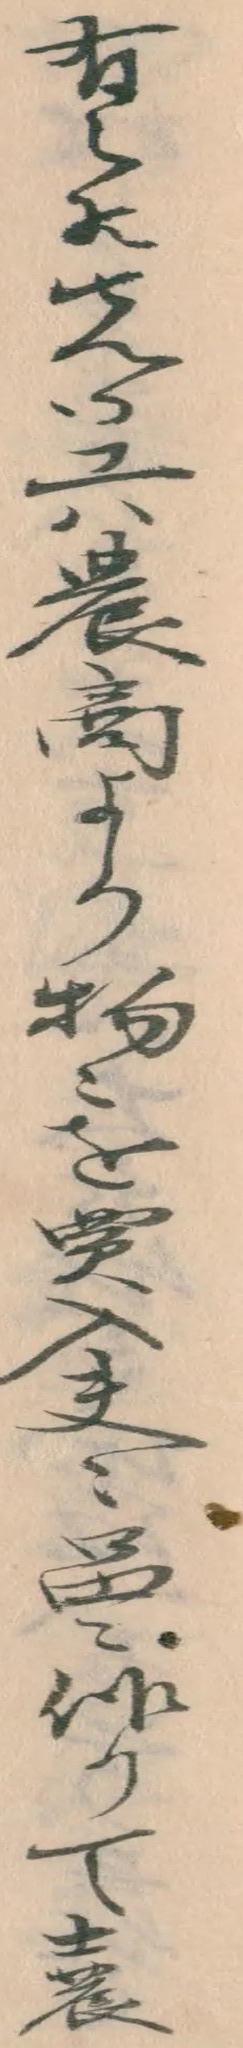有之候先つ工は農商より物々を買入夫々品々作りて士農
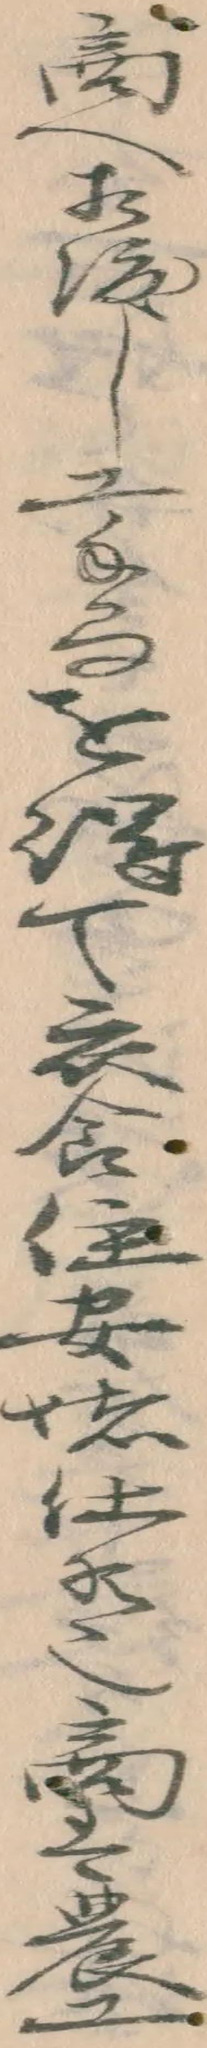商へ相渡し工手間を得て衣食住安堵仕候也商は農工
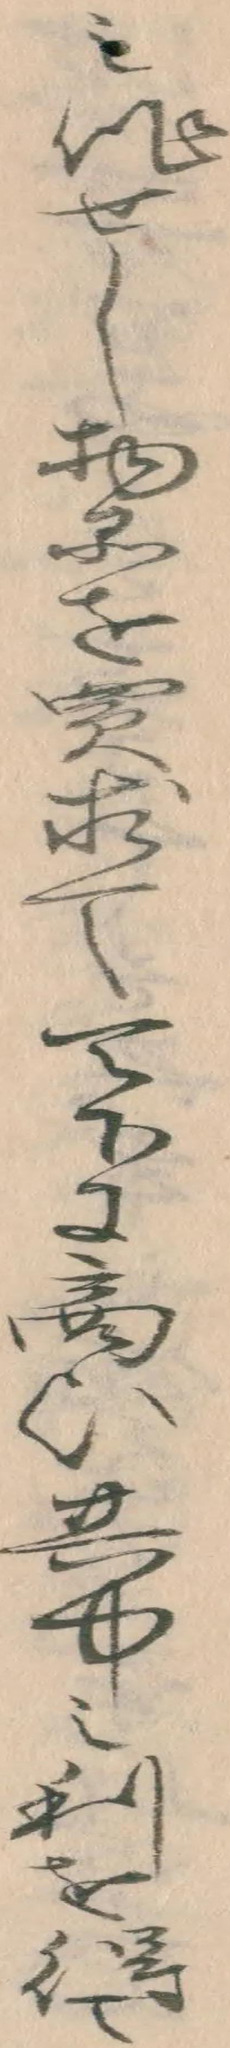之作せし物品を買求て天下に商ひ其中之利を得て
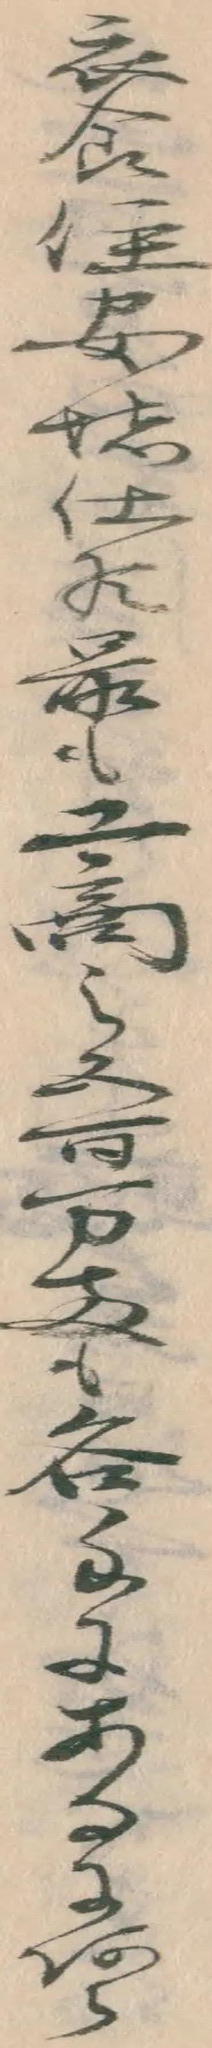衣食住安堵仕候最も工商之五百万両も各手にあるにあら
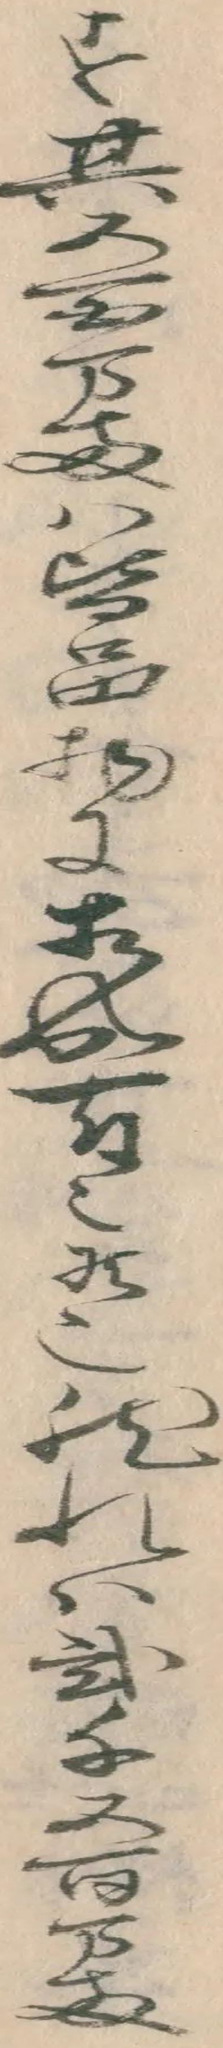す其五百万両は皆品物に相成有之候也然れは弐千五百万両
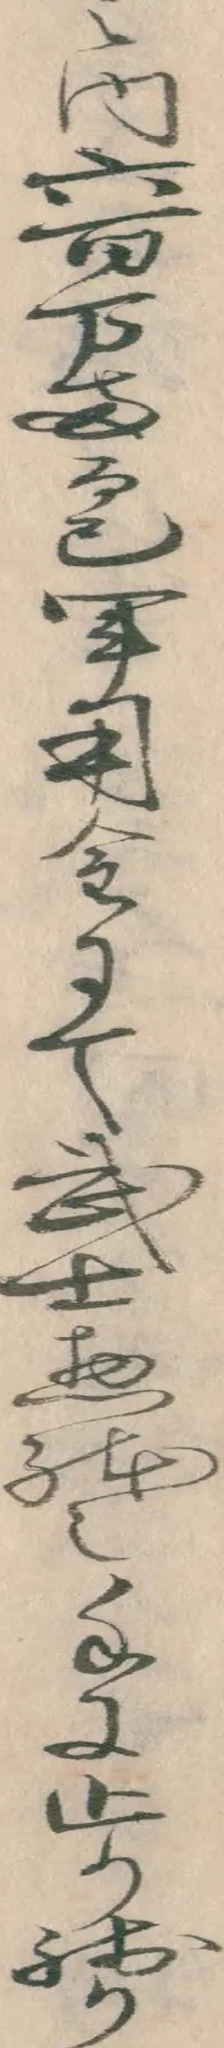之内六百万両而已軍用金にて武士惣体之手に止り残り
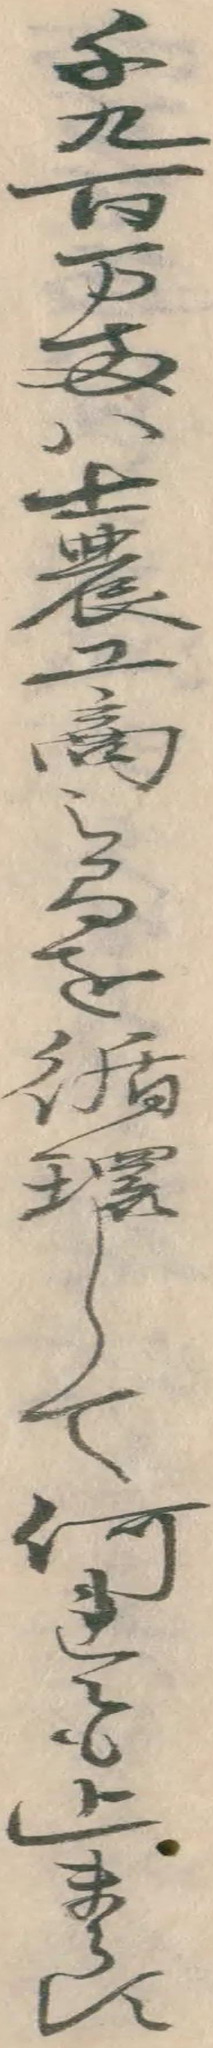千九百万両は土農工商之間を循環して何れにも止まらす
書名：斎庭之穂
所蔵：国立国会図書館 National Diet Library, JAPAN
